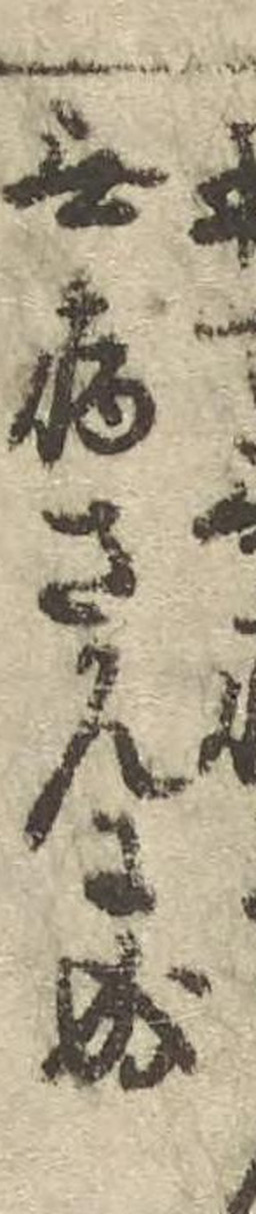無病さかんに成
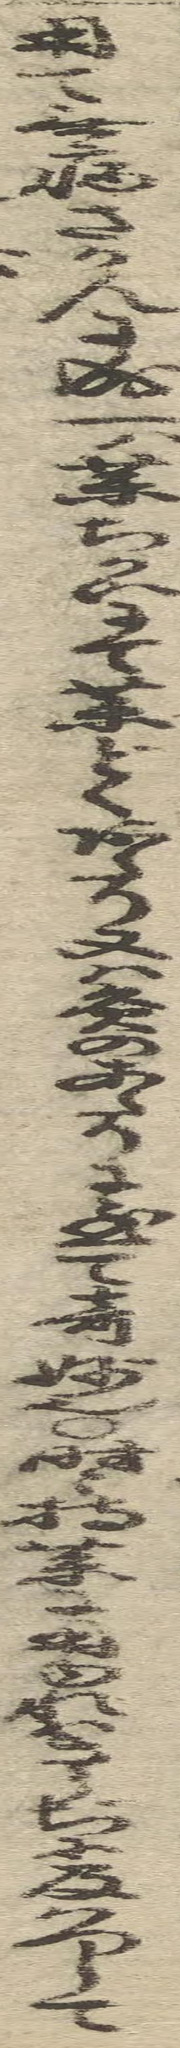用て無病さかんに成一は薬ちかいにて薬どくあたり又は灸のあたりに至て奇妙也〇時々持薬に用ゆれはきうぢに及はつして
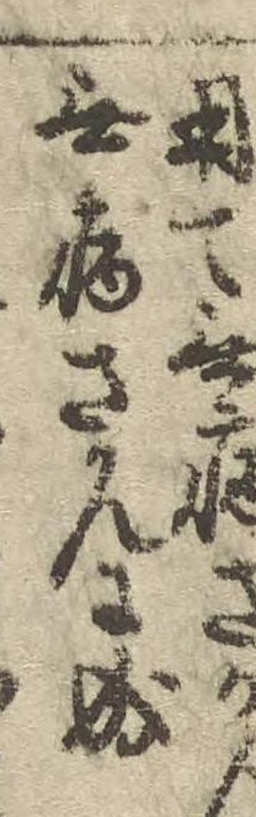無病さかんに成
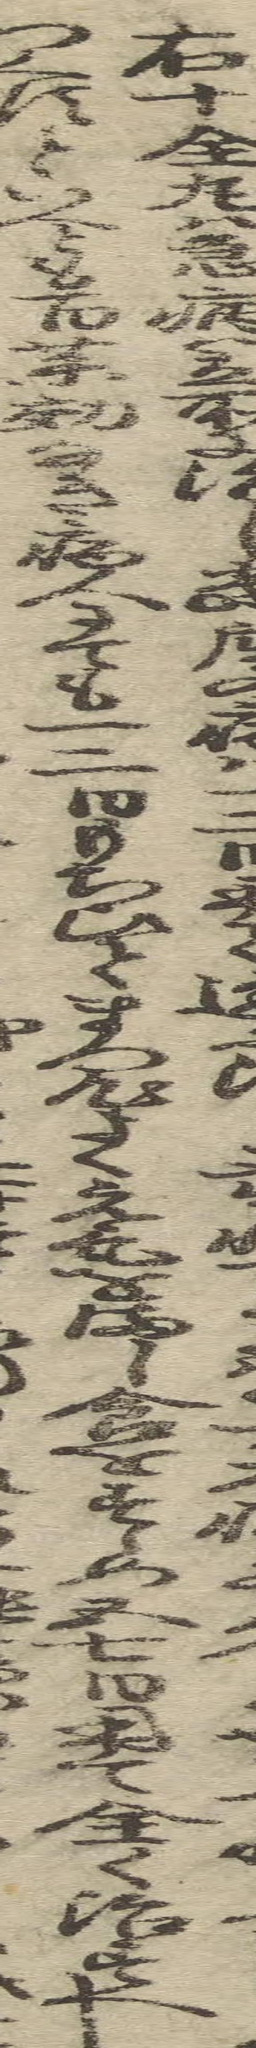つくすといへとも百薬効なき病人にても一二日もちひてまつ心よく元気をまし食をすゝめ五七日用て全く治すへし
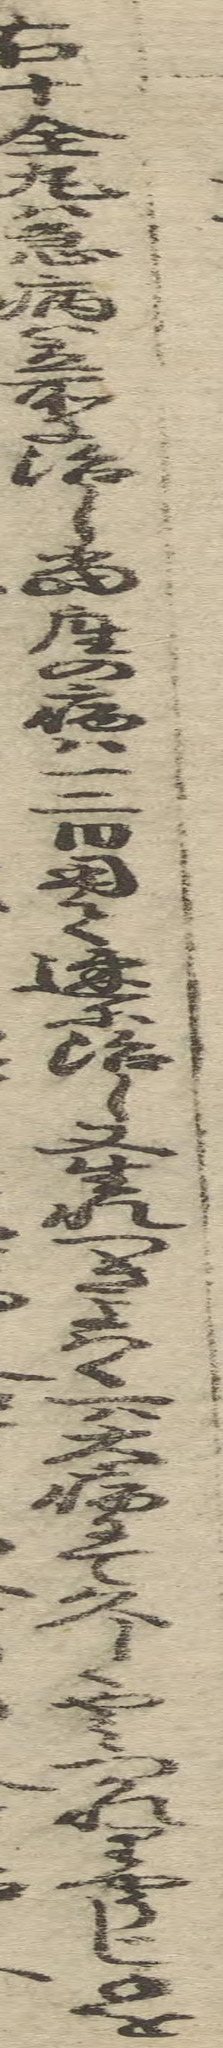右十全丸は急病は立所に治し当座の病は一二日用て速に治し又生れつきよはく一は大病にて久しくやみつかれりやうじ手を
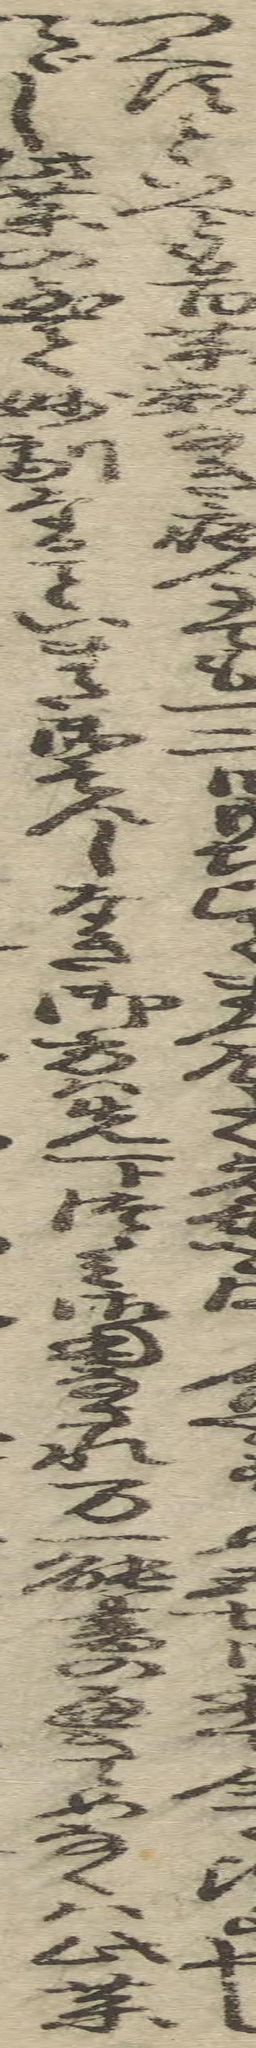たゞし此薬の至て妙剤なることいまた御そんしなき御方は先一トつゝみ御用なされ万一能書の通きゝめなくは此薬
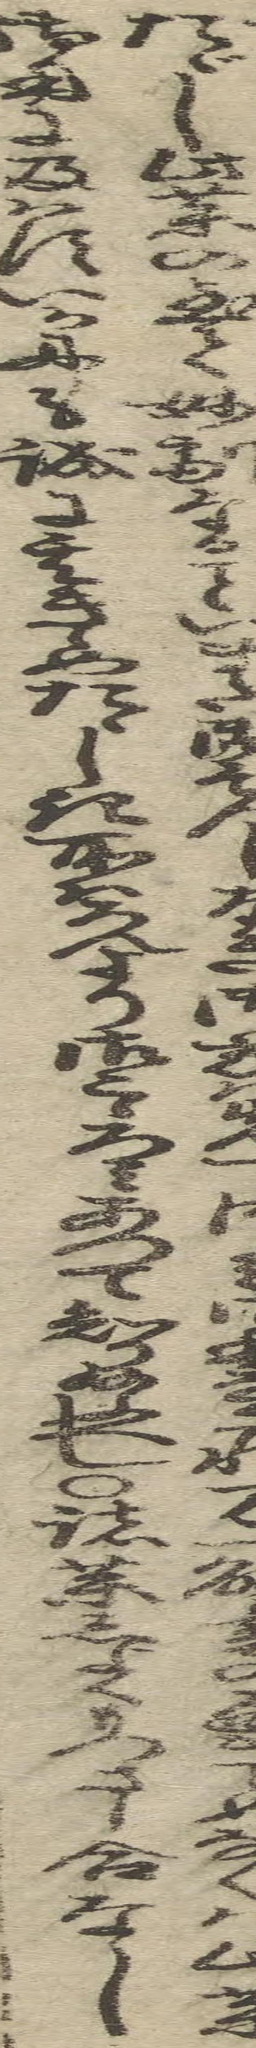御用に及はすいかにも誠に其きゝめたゝしき所はろんより御こゝろみあつて知り給ふへし〇諸薬しよくもつさし合なし
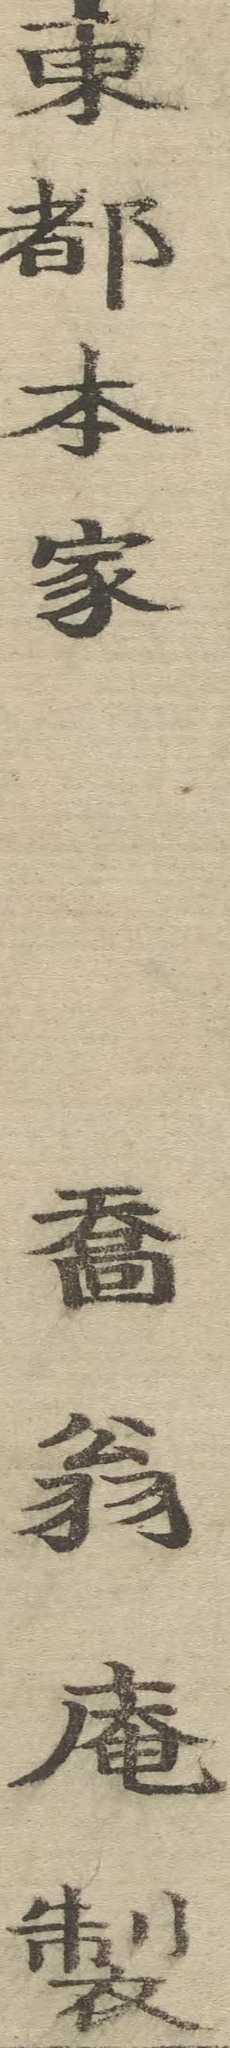東都本家喬翁庵製
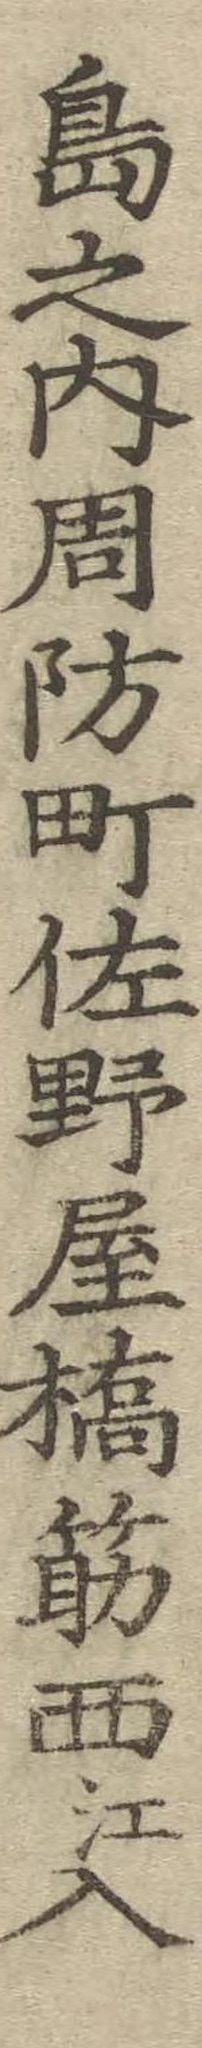島之内周防町佐野屋橋筋西江入

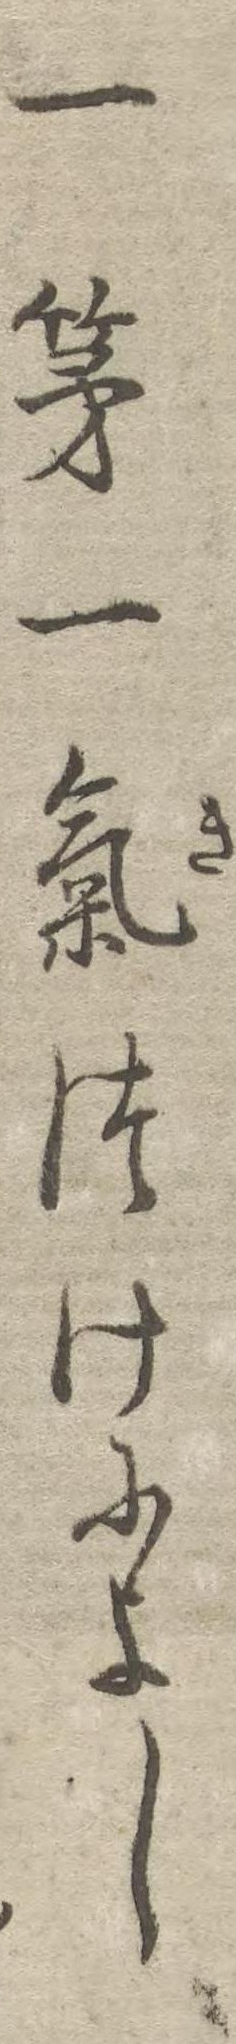一第一気つけによし
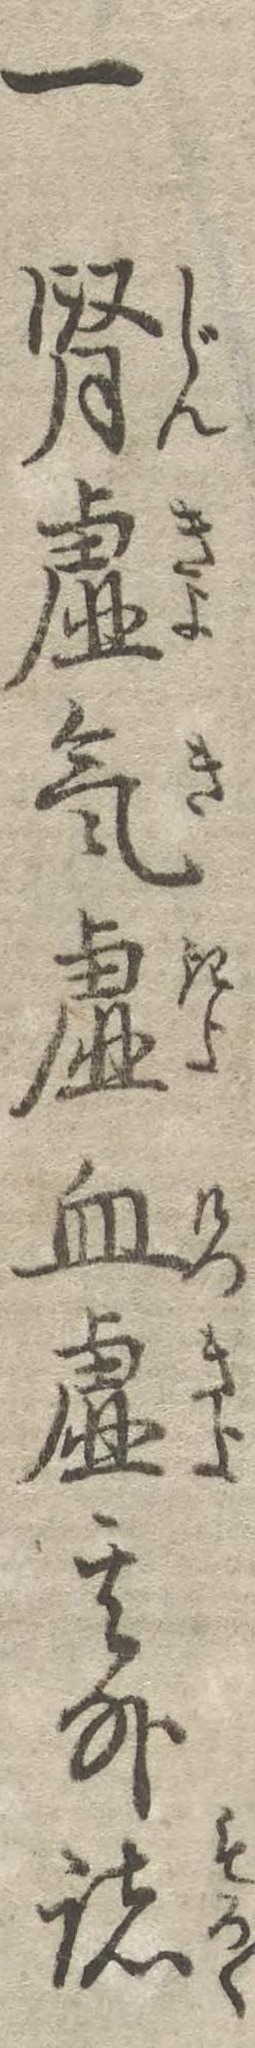一腎虚気虚血虚其外諸
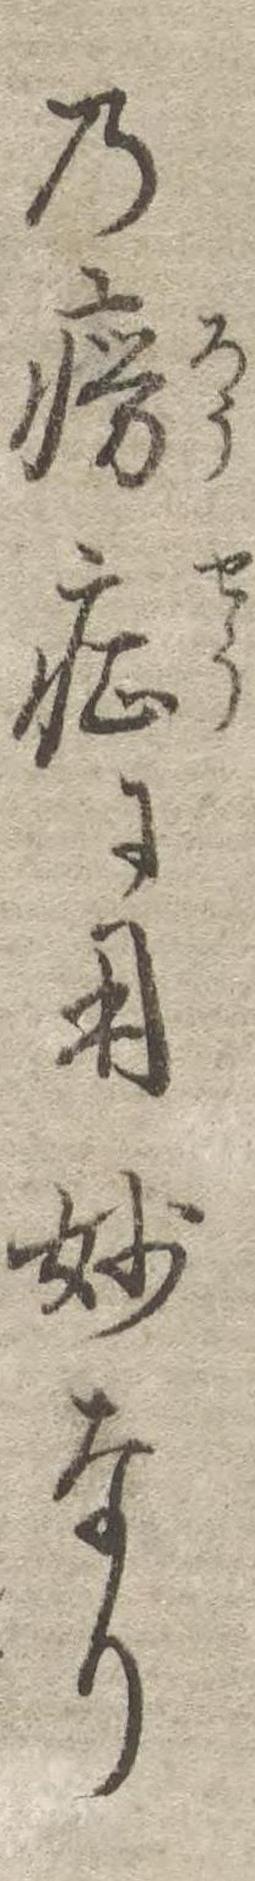の癆症に用妙なり
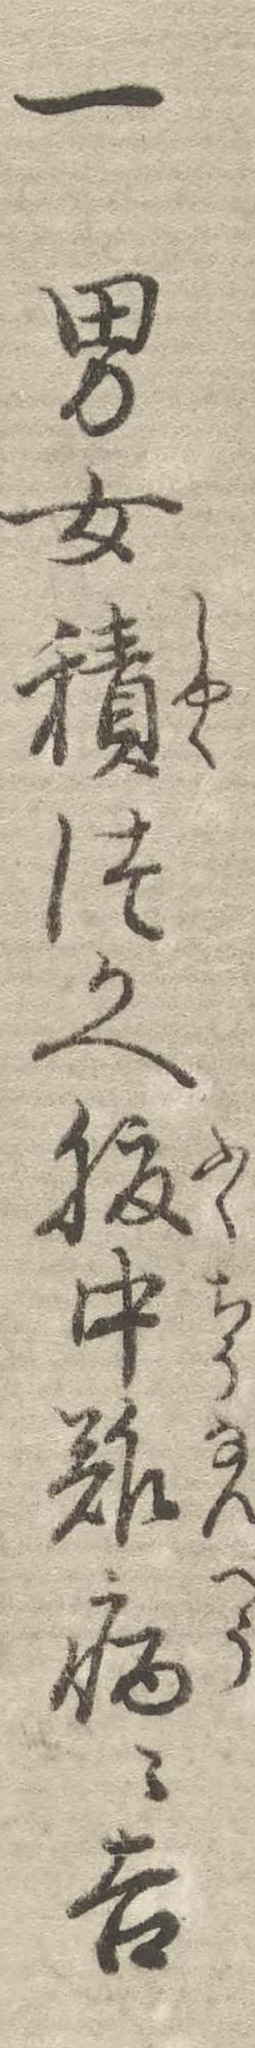一男女積つかへ腹中難病に吉
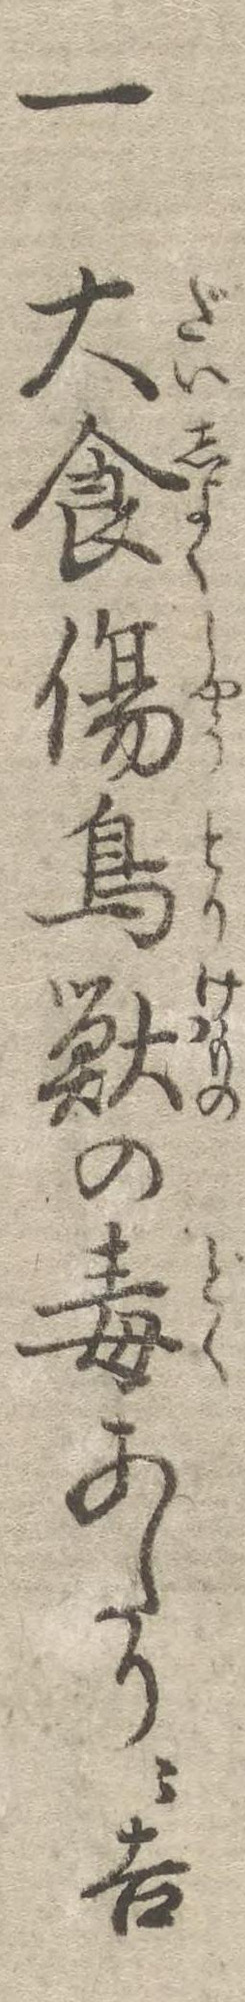一大食傷鳥獣の毒あたりに吉
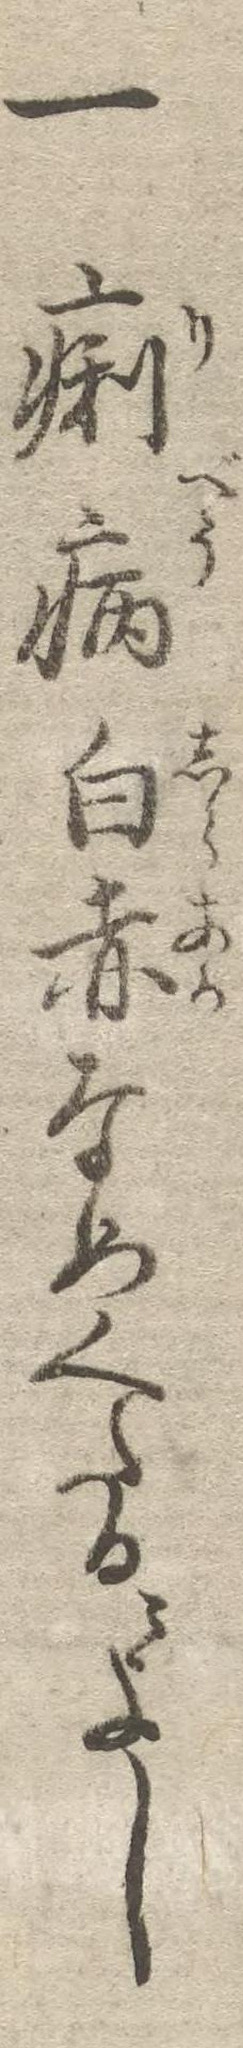一痢病白赤なめくたるによし
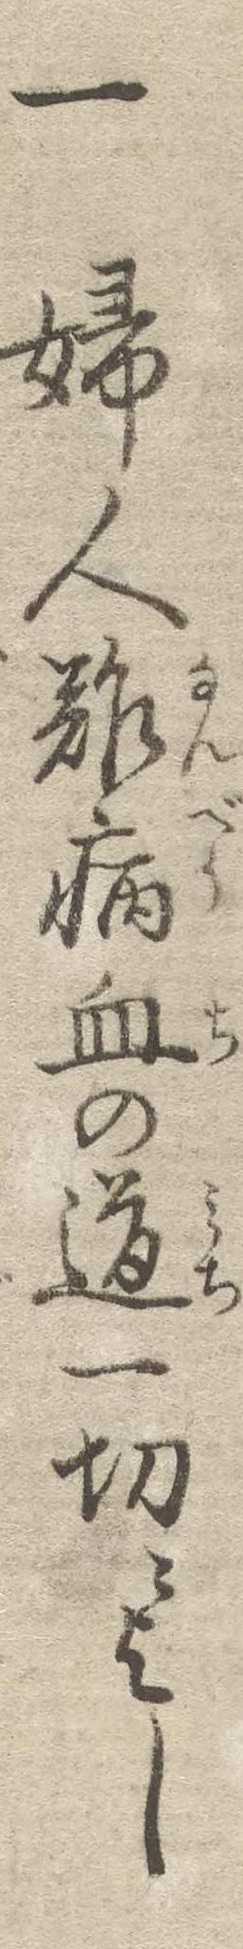一婦人難病血の道一切によし
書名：浪華薬種問屋能書張交帖. 二
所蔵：国立国会図書館 National Diet Library, JAPAN
